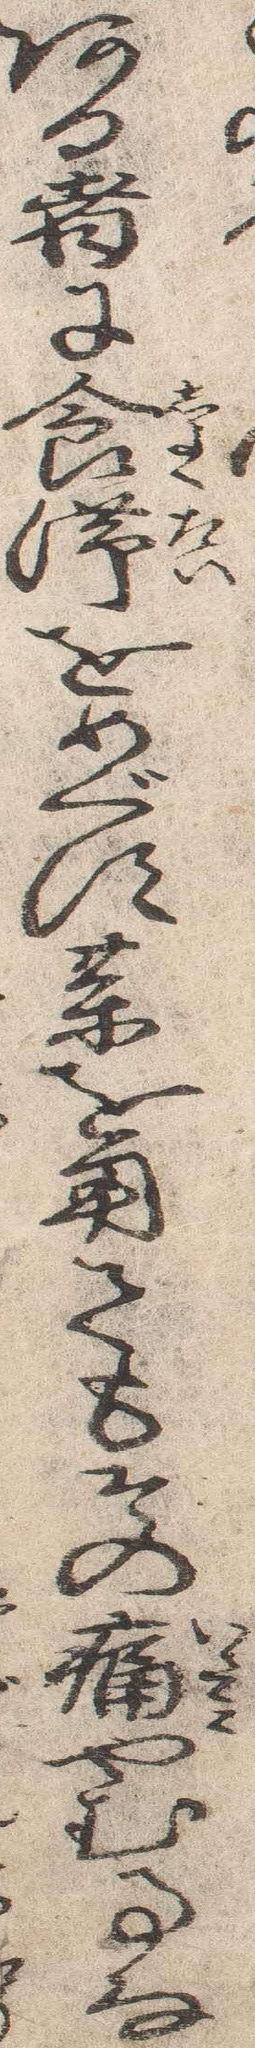ある者に食滞をめぐす薬を用てもその痛やむ事な
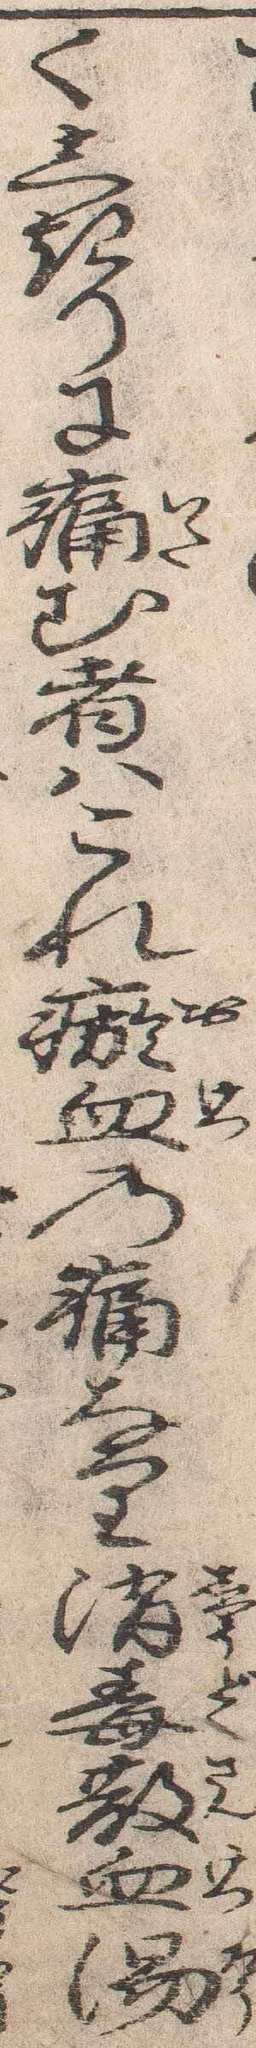くしきりに痛む者はこれ瘀血の痛なり消毒散血湯

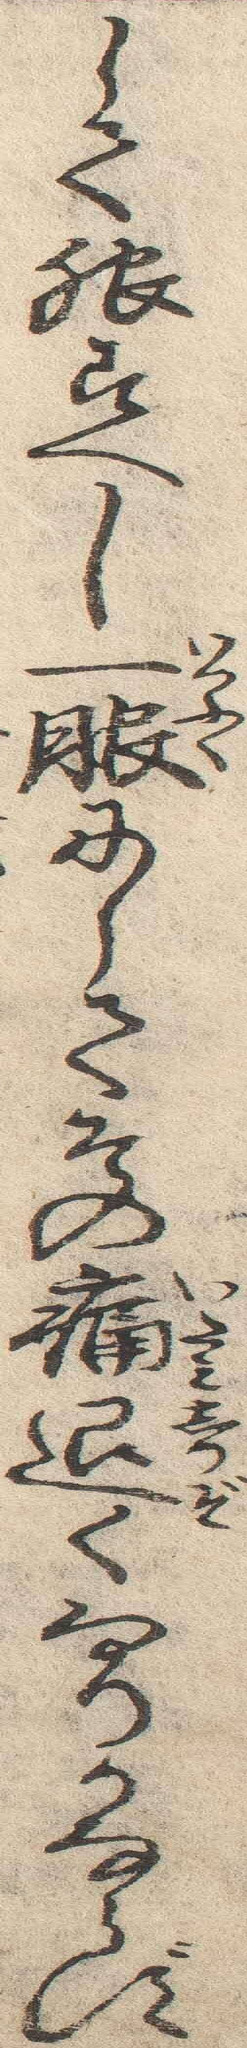して服すへし一服にしてその痛退くなりかならず
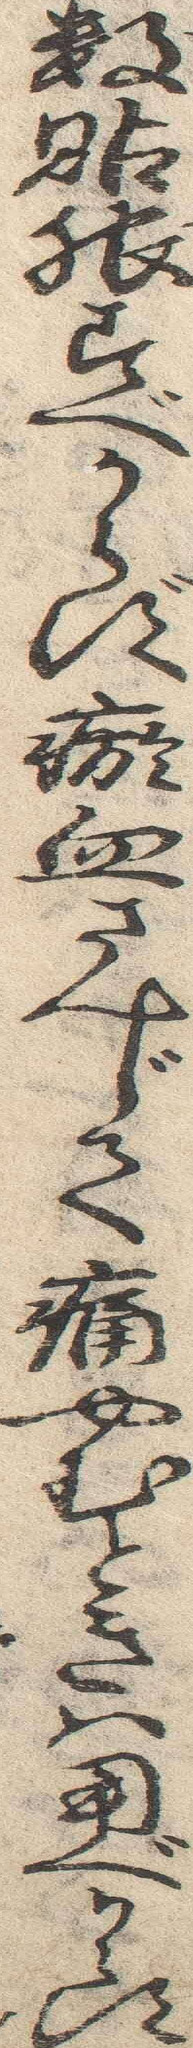数貼服すべからず瘀血さんじて痛やむときは用べからす
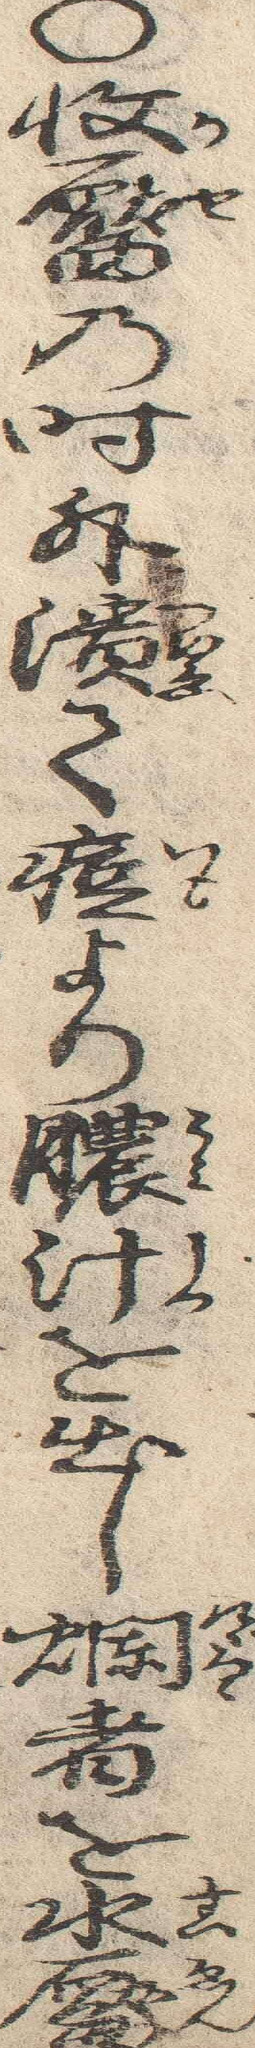○収靨の時外潰て痘より膿汁を出し爛者を水靨
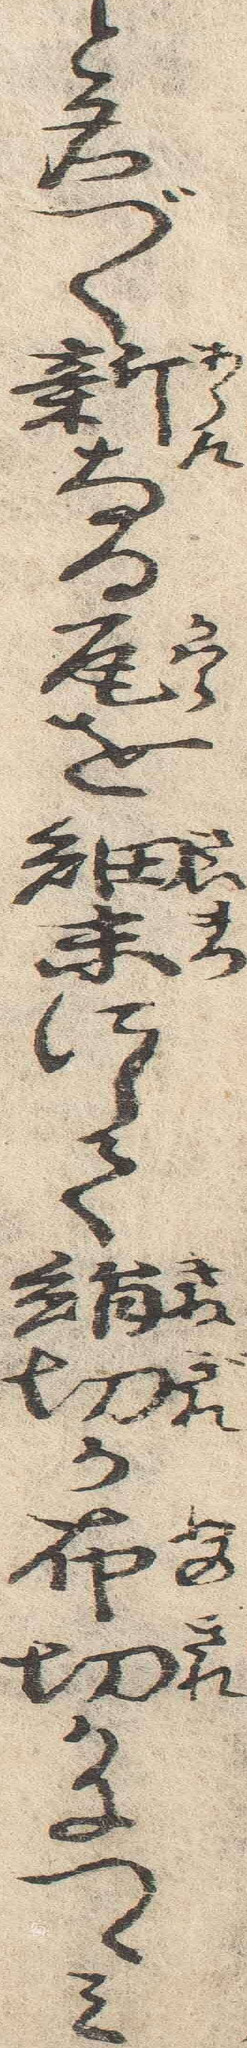と名づく新なる瓦を細末にして絹切か布切かにつゝみ
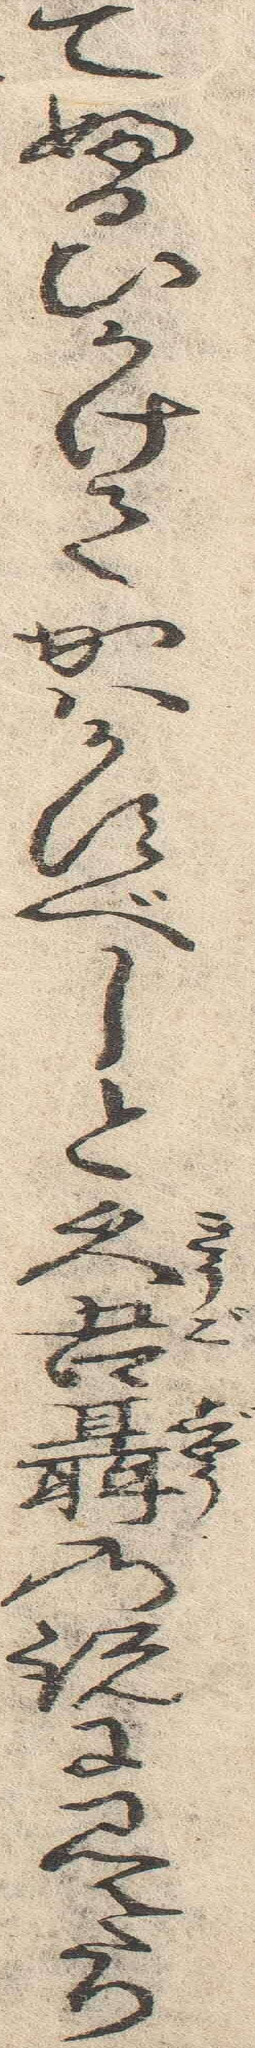てふるひかけてかはかすべしと久吾聶の説に見えたり
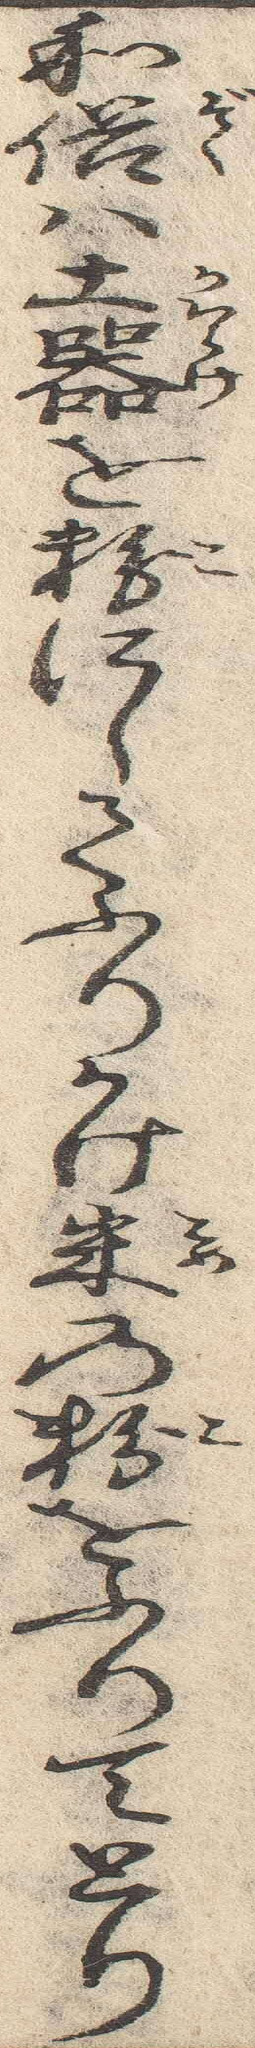和俗は土器を粉にしてふりかけ米の粉をふりてとり
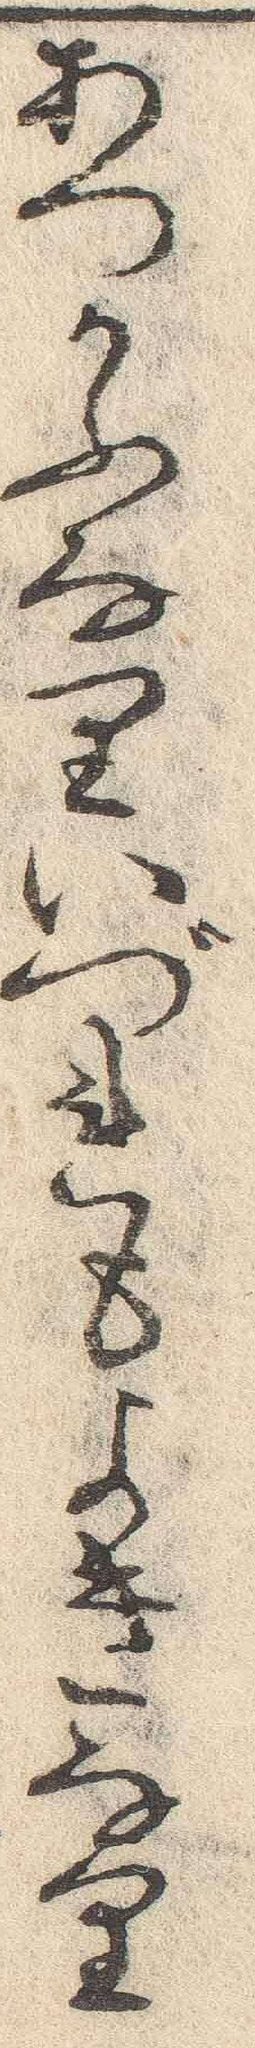あつかふなりいづれもよきなり
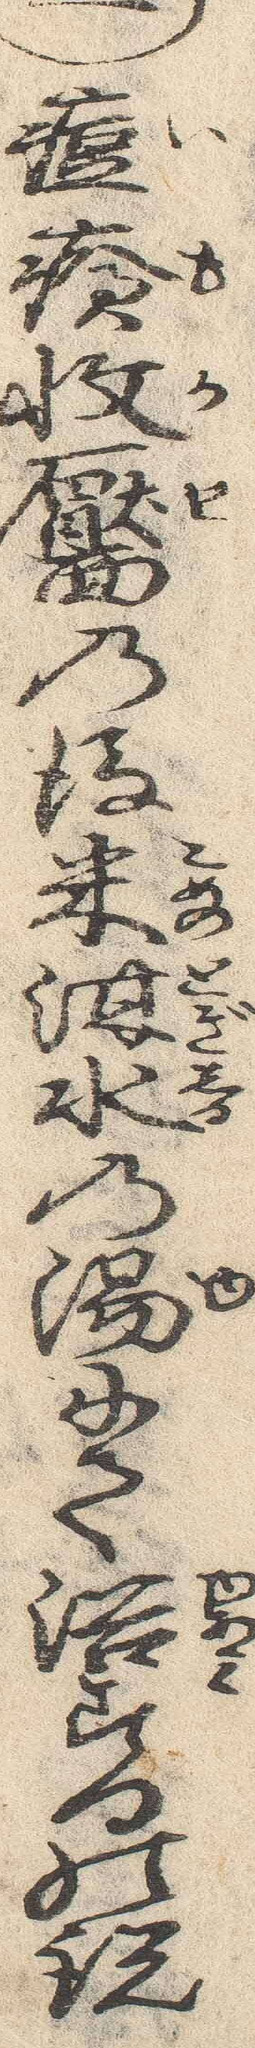㊁痘瘡収靨の後米泔水の湯にて浴するの説
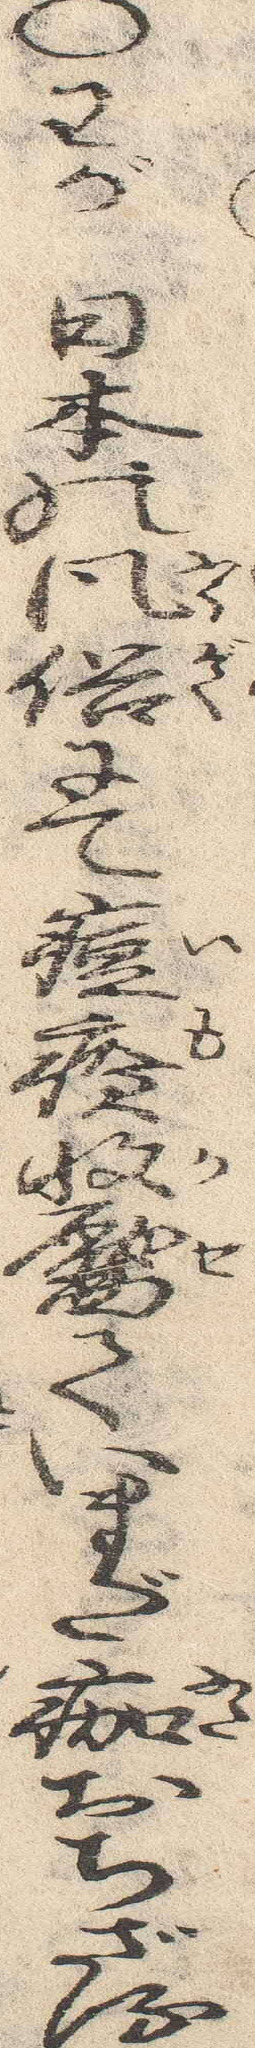○わが日本の風俗にて痘瘡収靨ていまだ痂おちざる
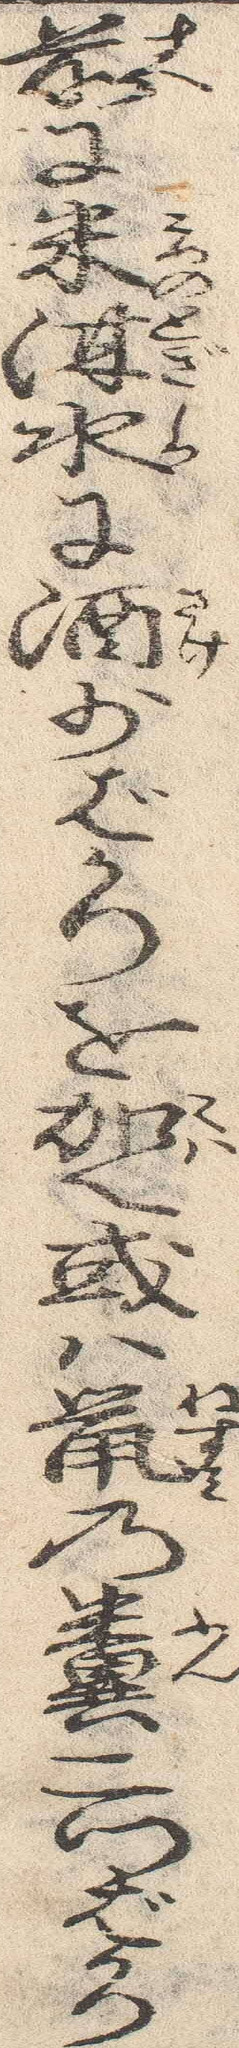前に米泔水に酒少ばかりを加え或は鼠の糞二ツばかり
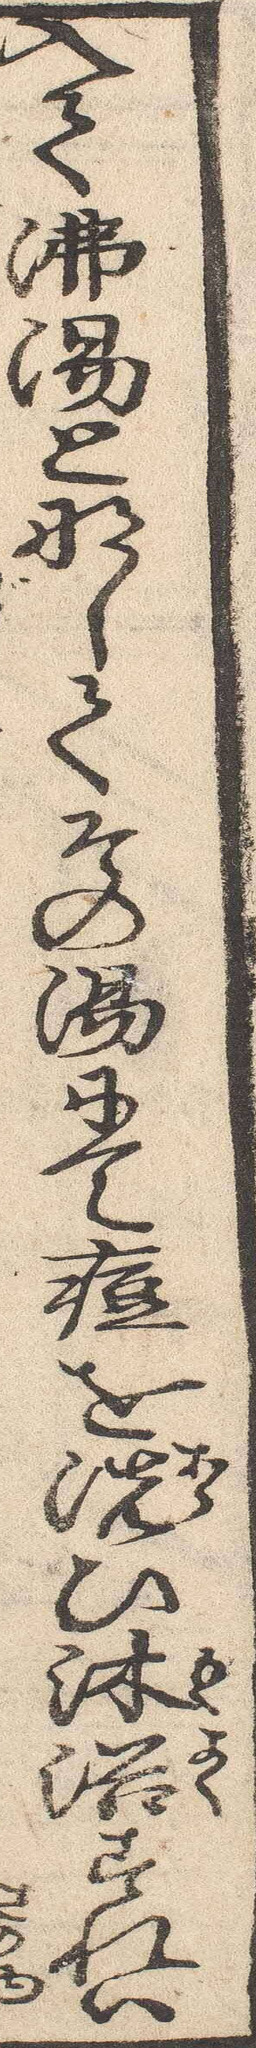入て沸湯となしてその湯にて痘を洗ひ沐浴すれは
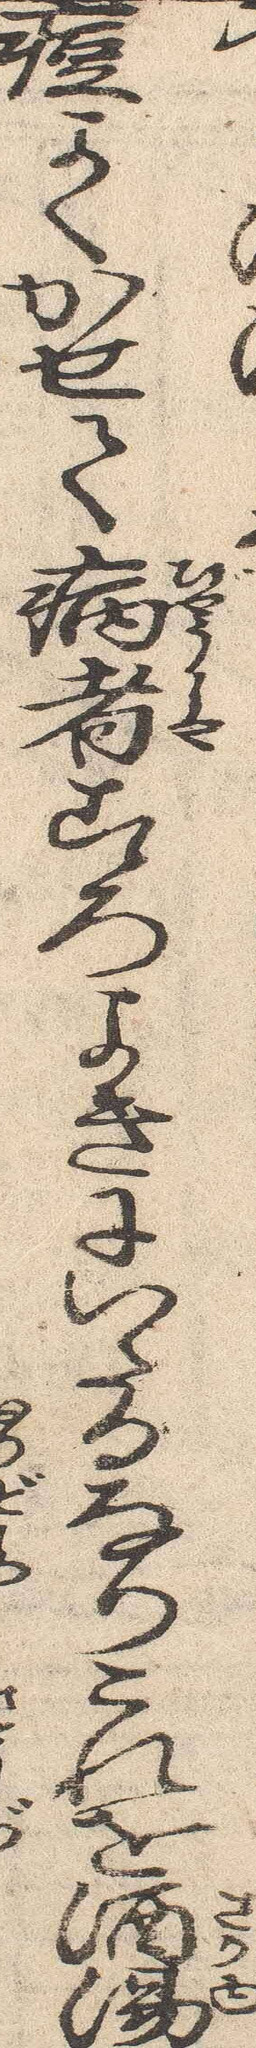痘よくかせて病者こゝろよきにいたるなりこれを酒湯
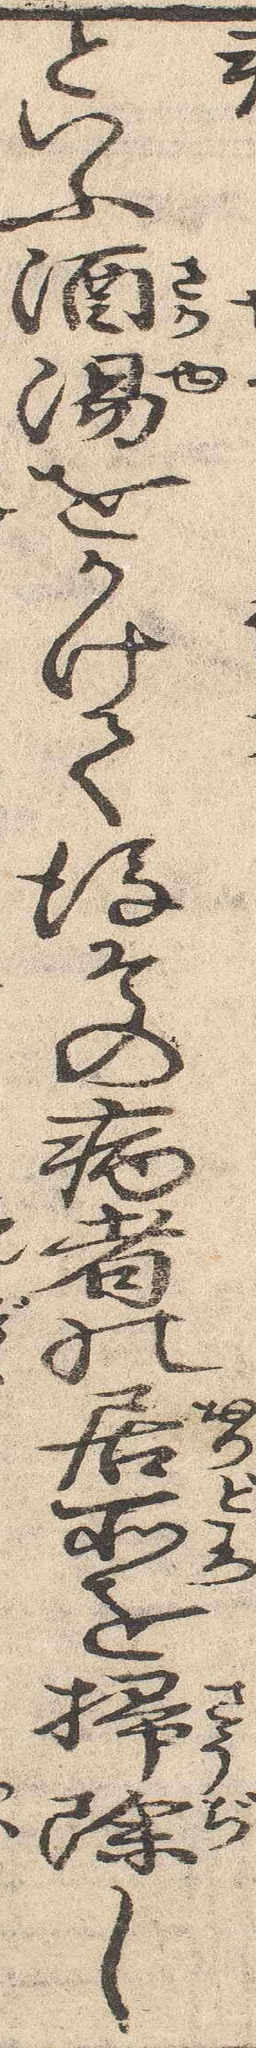といふ酒湯をかけて後その病者の居所を掃除し
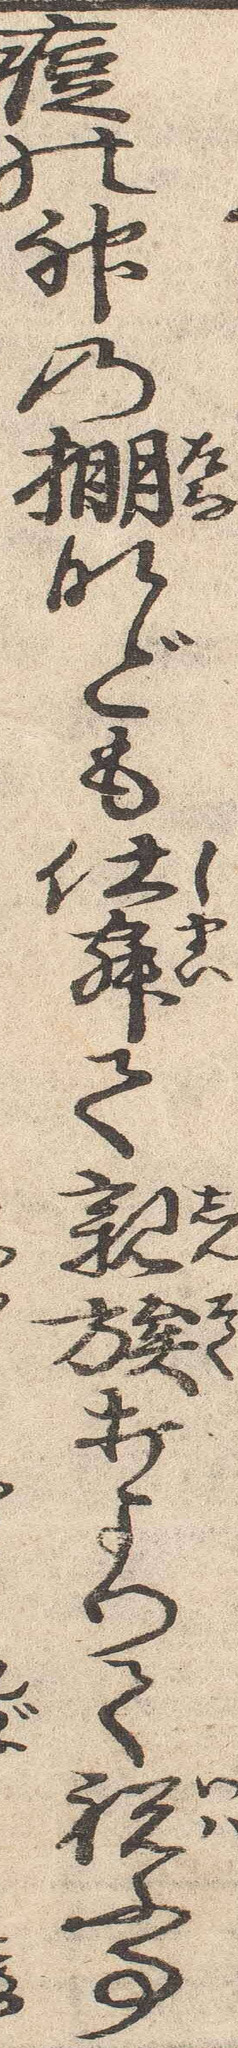痘の神の棚なども仕舞て親族打よりて祝ふ事
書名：小児必用養育草
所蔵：東京学芸大学附属図書館 国文学研究資料館
